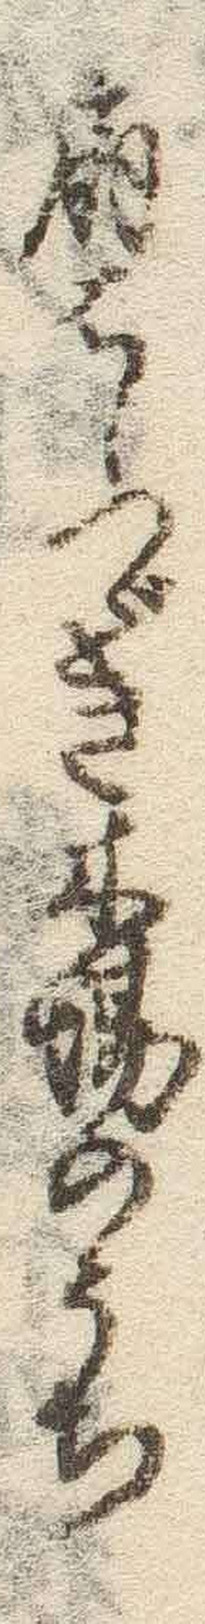扇はしつゞき木場のうち
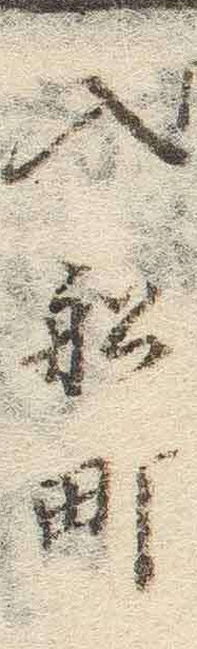入船町
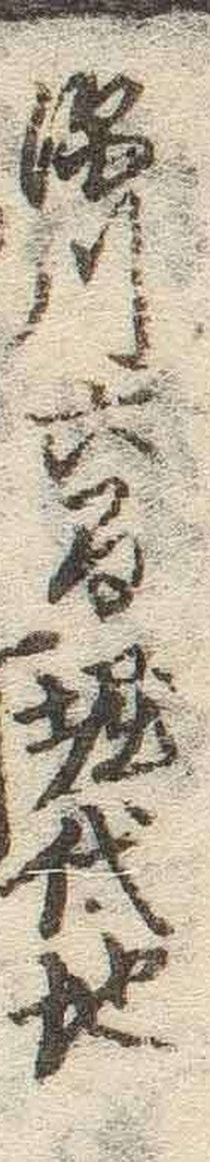深川六間堀代地
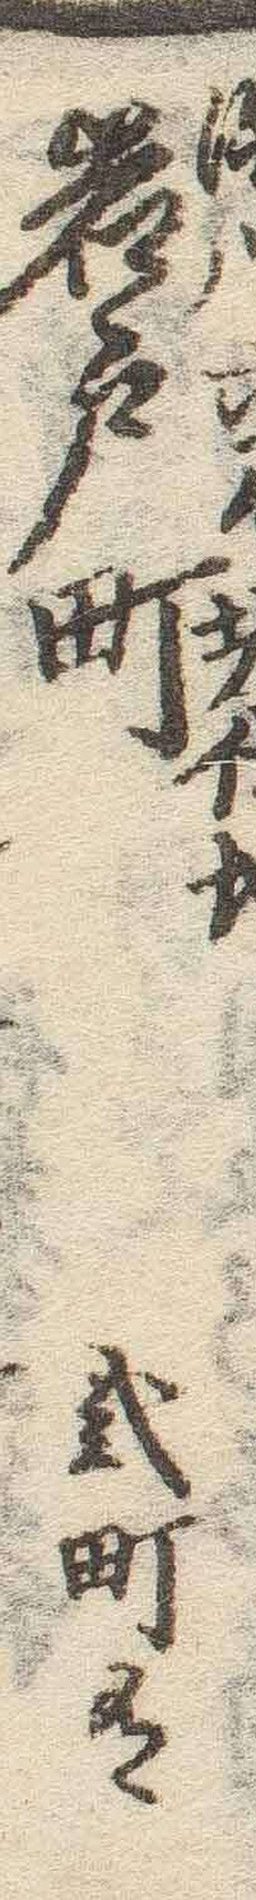岩戸町弐町有
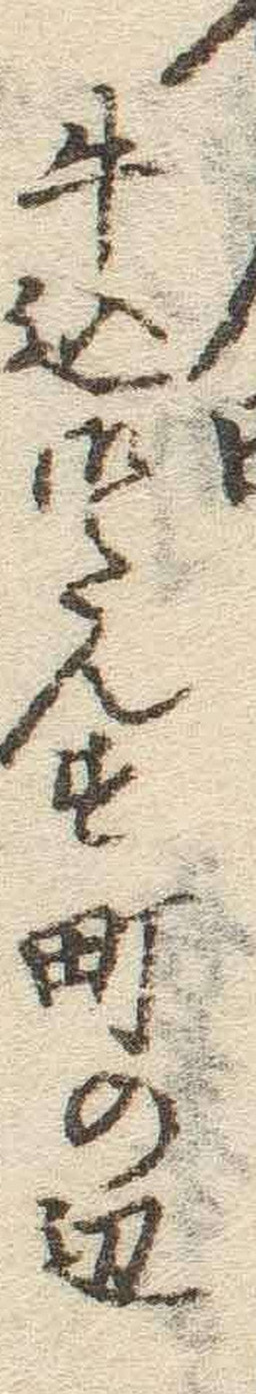牛込御たんす町の辺
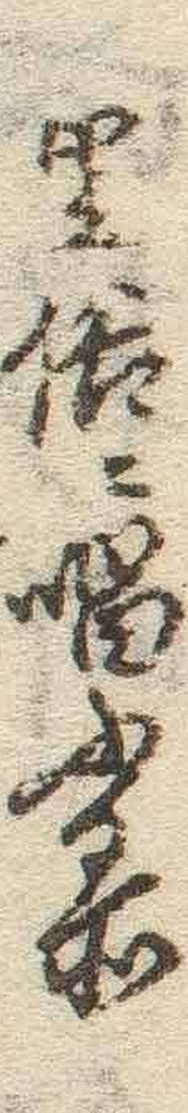里俗に唱ふる所
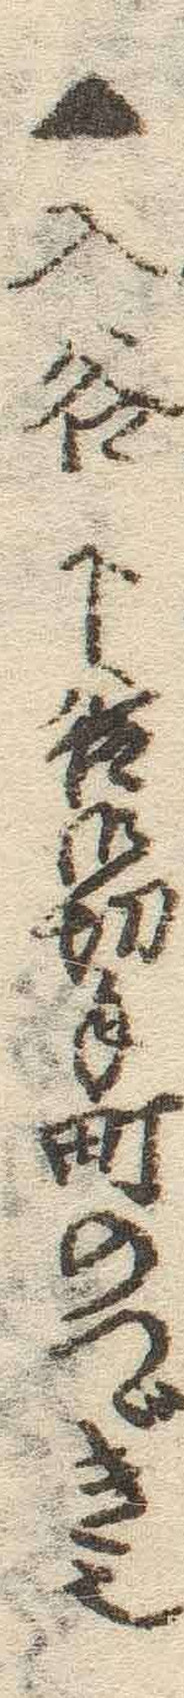▲入谷下谷御切手町のつゞき也
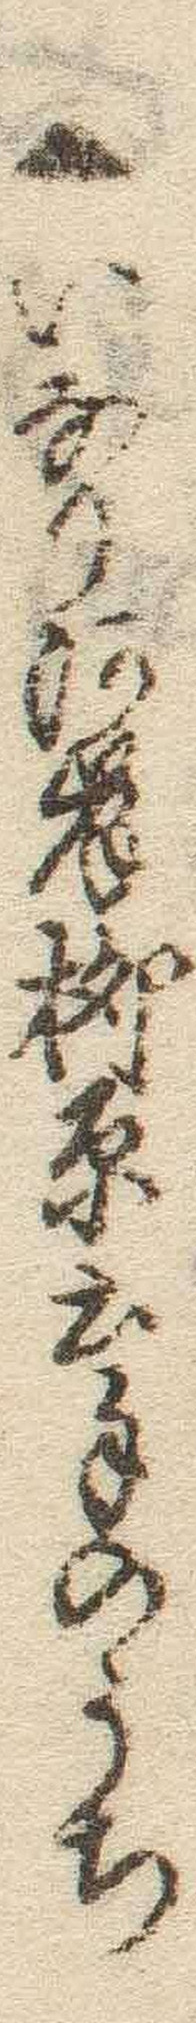▲いなり河岸柳原土手のうち
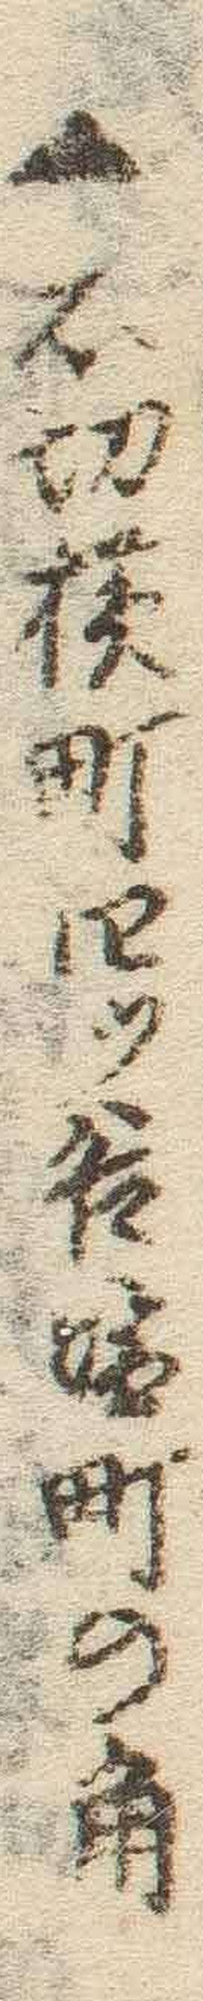▲石切横町四ツ谷塩町の角
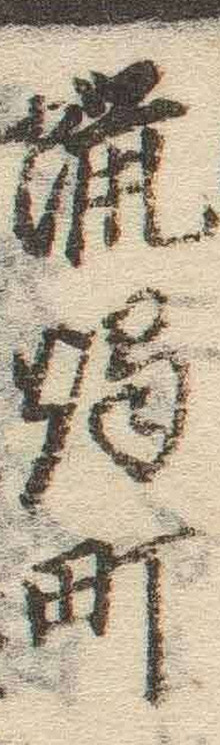蝋燭町
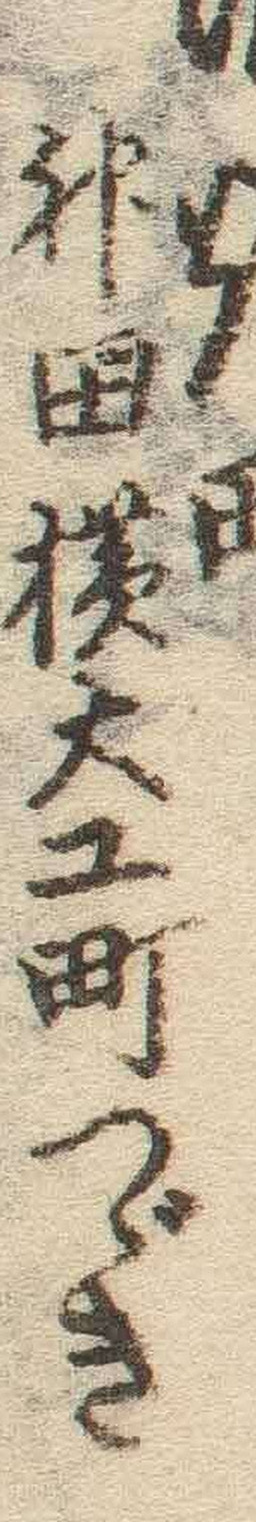神田横大工町つゞき
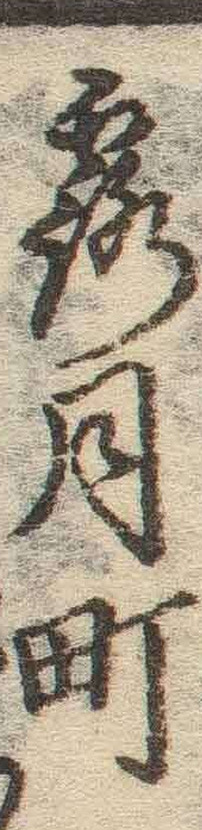露月町
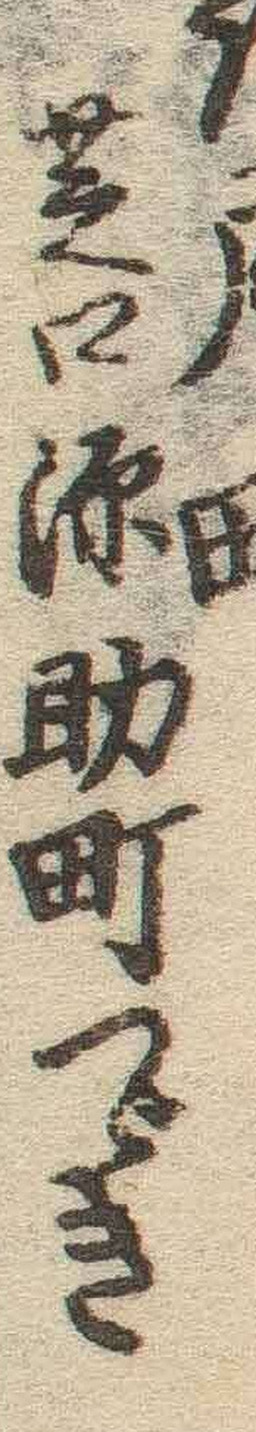芝口源助町つゞき

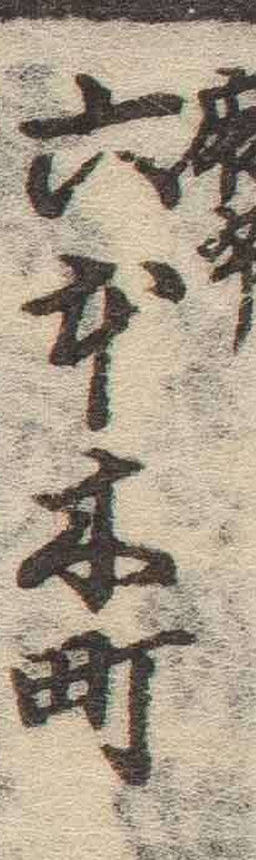六本木町
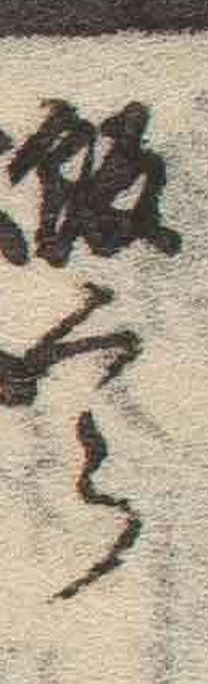飯くら
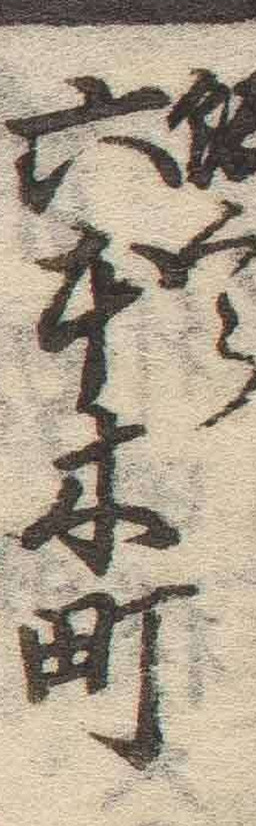六本木町
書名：江戸町独案内
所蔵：東京学芸大学附属図書館 国文学研究資料館
